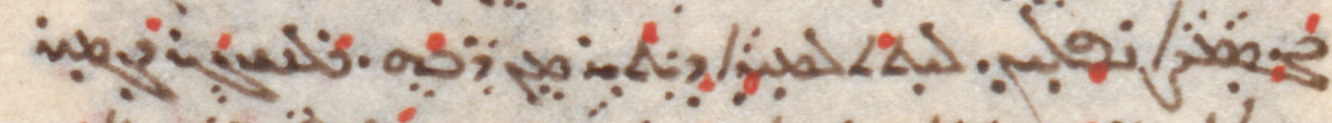ܒܓܘܡܨܐ ܢܦܠܝܢ܆ ܠܝܬ ܬܠܡܝܕܐ ܕܝܬܝܪ ܡ̣ܢ ܪܒܗ. ܟܠܢܫ ܓܝܪ ܕܓܡܝܪ
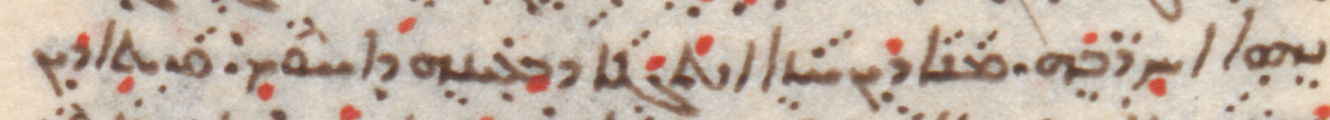ܢܗܘ̣ܐ ܐܝܟ ܪܒܗ. ܡܢܐ ܕܝܢ ܚܙܐ ܐܢܬ ܓܠܐ ܕܒܥܝܢܗ ܕܐܚܘܟ. ܩܕܝܬܐ ܕܝܢ
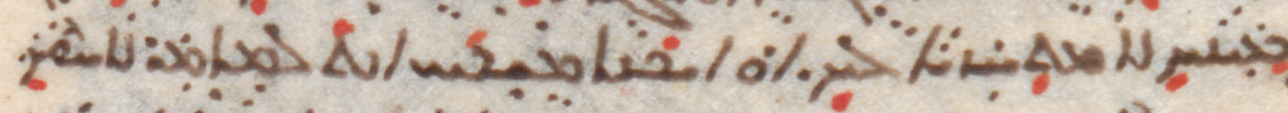ܕܒܥܝܢܟ ܠܐ ܡܬܚܙܝܐ ܠܟ. ܐܘ ܐܝܟܢܐ ܡܫܟܚ ܐܢܬ ܠܡܐܡܪ ܠܐܚܘܟ.
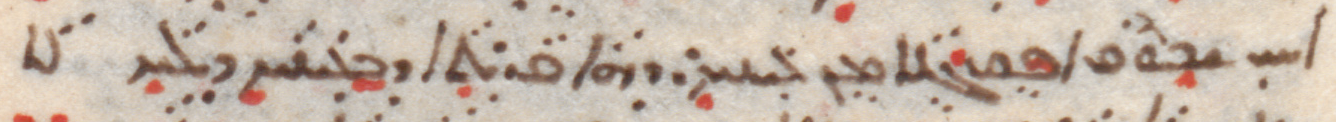ܐܚܝ ܫܒܘܩ ܐܦܩ ܓܠܐ ܡ̣ܢ ܥܝܢܟ܇ ܕܗܐ ܩܪܝܬܐ ܕܒܥܝܢܟ ܕܝܠܟ ܠܐ
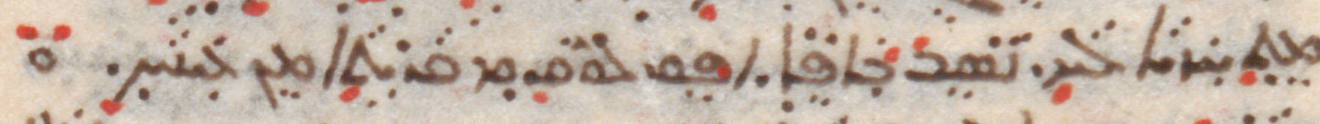ܡܬܚܙܝܐ ܠܟ. ܢ̇ܣܒ ܒܐܦ̈ܐ܆ ܐܦܩ ܠܘܩܕܡ ܩܪܝܬܐ ܡ̣ܢ ܥܝܢܟ. ܏ܘ
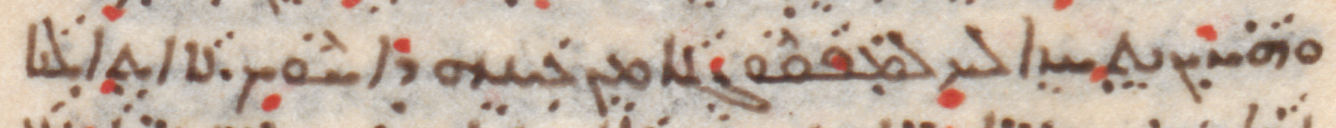ܘܗܝܕܝܢ ܢܬܚܙܐ ܠܟ ܠܡܦܩܘ ܓܠܐ ܡ̣ܢ ܥܝܢܗ ܕܐܚܘܟ. ܠܐ ܐܝܬ ܐܝܠܢܐ
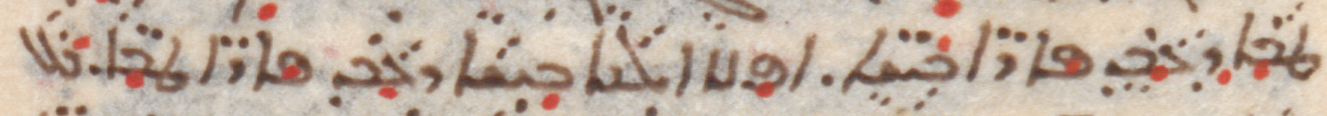ܛܒܐ ܕܥܒ̇ܕ ܦܐܪ̈ܐ ܒܝ̈ܫܐ. ܐܦ ܠܐ ܐܝܠܢܐ ܒܝܫܐ ܕܥ̇ܒܕ ܦܐܪ̈ܐ ܛܒ̈ܐ. ܟܠ
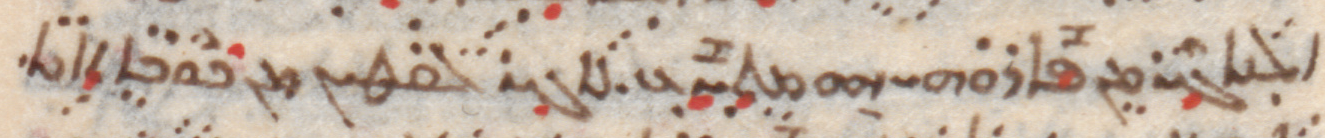ܐܝܠܢܐ ܓܝܪ ܡ̣ܢ ܦܐܪ̈ܘܗܝ ܗܘ ܡܬܝܕܥ. ܠܐ ܓܝܪ ܠܩ̇ܛܝܢ ܡ̣ܢ ܟܘ̈ܒܐ ܬܐܢ̈ܐ
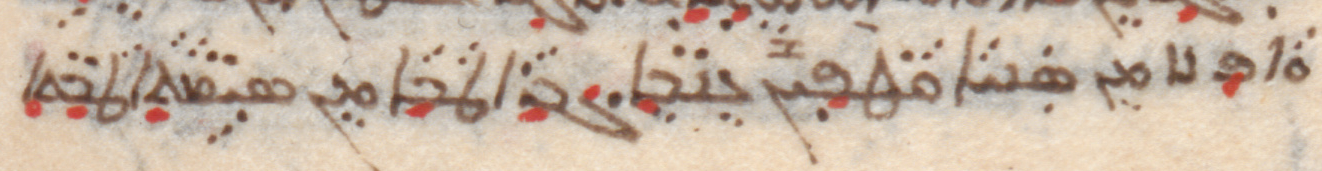ܘܐܦ ܠܐ ܡ̣ܢ ܣܢܝܐ ܩ̇ܛܦܝܢ ܥܢ̈ܒܐ. ܓܒܪܐ ܛܒܐ ܡ̣ܢ ܣܝ̈ܡܬܐ ܛܒ̈ܬܐ
